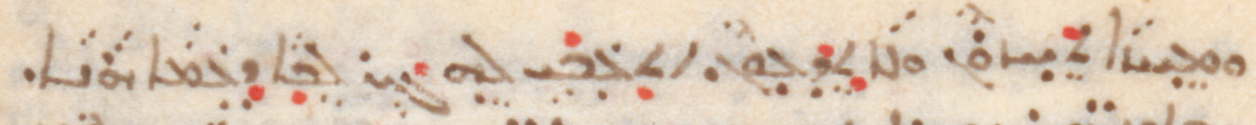ܘܡܚܙܐ ܬܚܙܘܢ ܘܠܐ ܬܕܥܘܢ. ܐܬܥܒܝ ܠܗ ܓܝܪ ܠܒܐ ܕܥܡܐ ܗܢܐ.
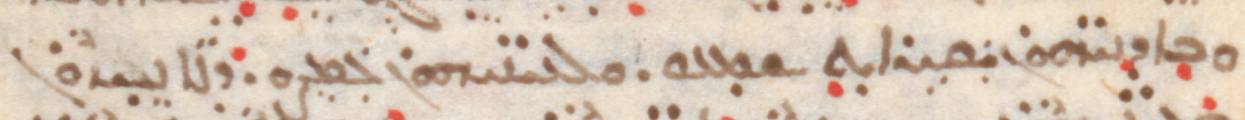ܘܒܐܕܢܝ̈ܗܘܢ ܝܩܝܪܐܝܬ ܫܡ̣ܥܘ. ܘܠܥܝܢ̈ܝܗܘܢ ܥܡܨܘ. ܕܠܐ ܢܚܙܘܢ
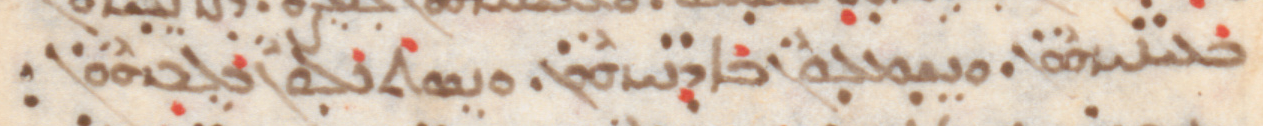ܒܥܝ̈ܢܝܗܘܢ. ܘܢܫ̣ܡܥܘܢ ܒܐܕ̈ܢܝܗܘܢ. ܘܢܣܬܟܠܘܢ ܒܠܒܗܘܢ.
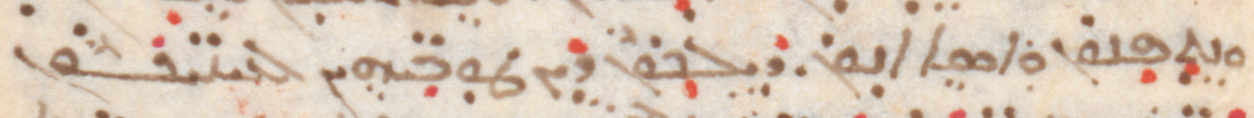ܘܢܬܦܢܘܢ ܘܐܣܐ ܐܢܘܢ. ܕܝܠܟܘܢ ܕܝܢ ܛܘܒ̈ܝܗܝܢ ܠܥܝܢ̈ܝܟܘܢ
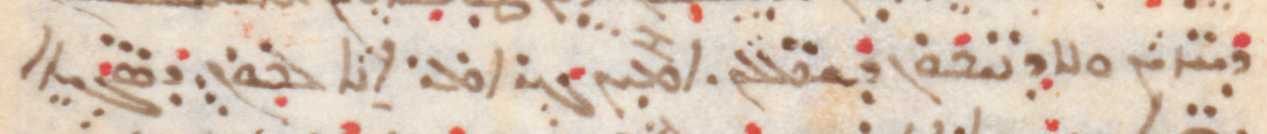ܕܚܙܝܢ ܘܠܐܕܢܝ̈ܟܘܢ ܕܫܡ̈ܥܢ. ܐܡܝܢ ܓܝܪ ܐܡ̇ܪ ܐܢܐ ܠܟܘܢ܆ ܕܣܓ̈ܝܐܐ
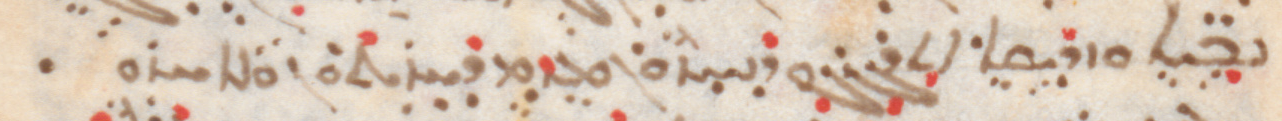ܢܒ̈ܝܐ ܘܙܕܝܩܐ ܐܬܪܓܓܘ ܕܢܚܙܘܢ ܡܕܡ ܕܚܙܝܬܘܢ ܘܠܐ ܚܙܘ.
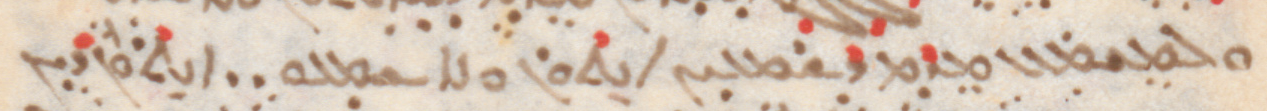ܘܠܡܫܡܥ ܡܕܡ ܕܫ̇ܡܥܝܢ ܐܢܬܘܢ ܘܠܐ ܫܡ̣ܥܘ. ܐܢܬܘܢ ܕܝܢ
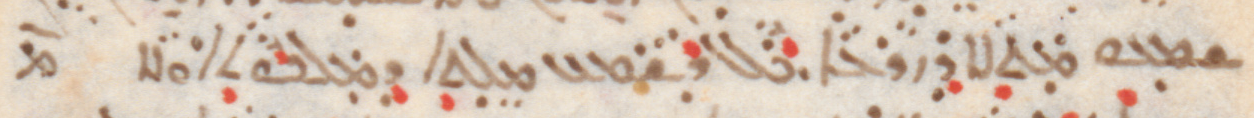ܫܡ̣ܥܘ ܡܬܠܐ ܕܙܪܥܐ. ܟܠ ܕܫ̇ܡܥ ܡܠܬܐ ܕܡܠܟܘܬܐ ܘܠܐ ܏ܡ
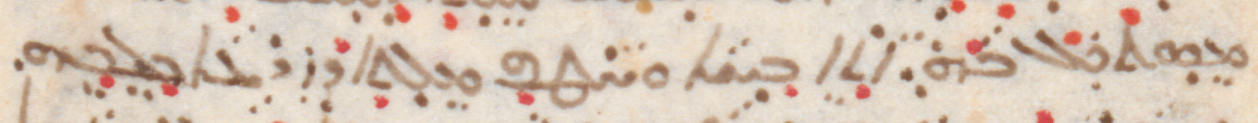ܡܣܬܟܠ ܒܗ̇܆ ܐܬܐ ܒܝܫܐ ܘܚ̇ܛܦ ܡܠܬܐ ܕܙܪܥܐ ܒܠܒܗ.
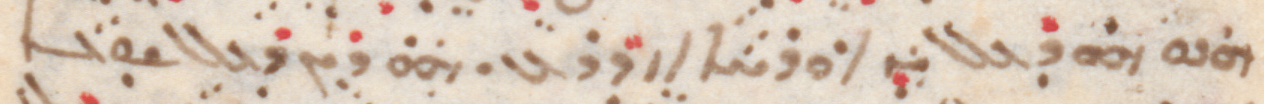ܗܢܘ ܗ̇ܘ ܕܥܠ ܝܕ ܐܘܪܚܐ ܐܙܕܪܥ. ܗ̇ܘ ܕܝܢ ܕܥܠ ܫܘܥܐ
